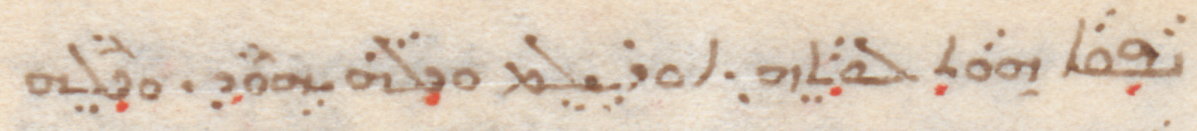ܢܦܩܐ ܗܘܬ ܠܘܬܗ܆ ܐܘܪܫܠܡ ܘܟܠܗ̇ ܝܗܘܕ. ܘܟܠܗ
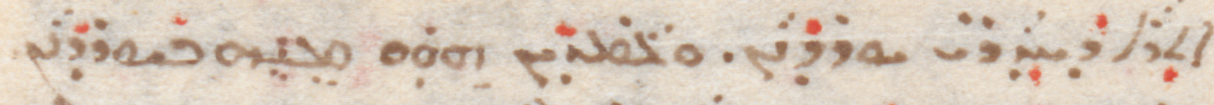ܐܬܪܐ ܕܚܕܪ̈ܝ ܝܘܪܕܢܢ. ܘܥ̇ܡܕܝܢ ܗܘܘ ܡܢܗ ܒܝܘܪܕܢܢ
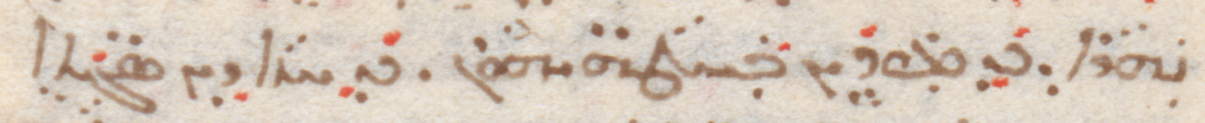ܢܗܪܐ܉ ܟܕ ܡܘܕܝܢ ܒܚܛܗ̈ܝܗܘܢ. ܟܕ ܚܙܐ ܕܝܢ ܣ̈ܓܝܐܐ
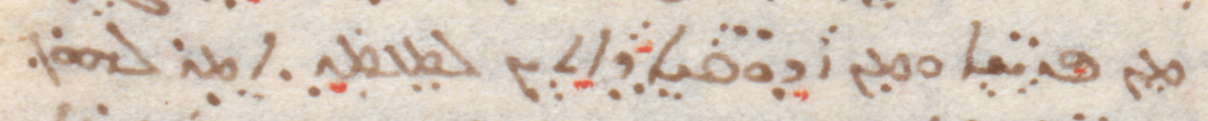ܡ̣ܢ ܦܪ̈ܝܫܐ ܘܡ̣ܢ ܙܕܘ̈ܩܝܐ ܕܐܬܝܢ ܠܡܥܡܕ. ܐܡ̣ܪ ܠܗܘܢ.
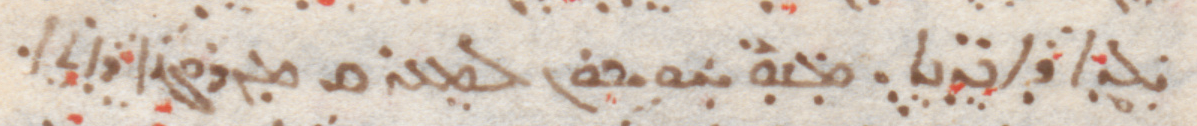ܝܠܕܐ ܕܐܟ̈ܕܢܐ܉ ܡܢܘ ܚܘܝܟܘܢ ܠܡܥܪܩ ܡ̣ܢ ܪܘܓܙܐ ܕܐ̇ܬܐ.
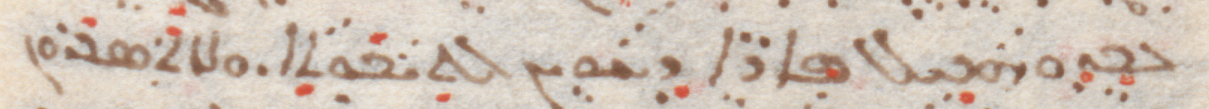ܥܒܕܘ ܗܟܝܠ ܦܐܪ̈ܐ ܕܫܘܝܢ ܠܬܝܒܘܬܐ. ܘܠܐ ܬܣܒܪܘܢ
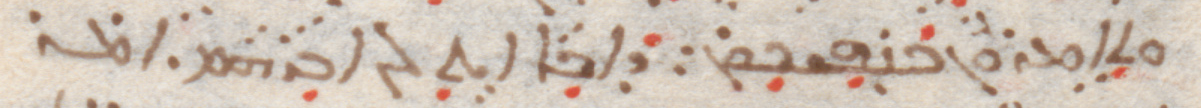ܘܬܐܡܪܘܢ ܒܢܦܫܟܘܢ: ܕܐܒܐ ܐܝܬ ܠܢ ܐܒܪܗܡ. ܐܡ̇ܪ
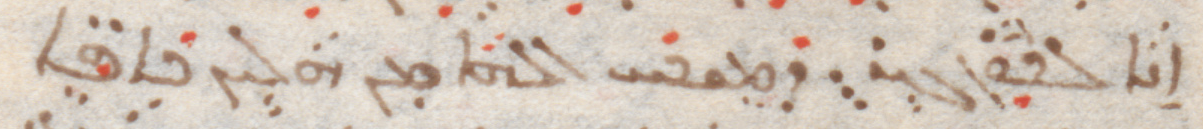ܐܢܐ ܠܟܘܢ ܓܝܪ܆ ܕܡܫܟܚ ܐܠܗܐ ܡ̣ܢ ܗܠܝܢ ܟܐܦ̈ܐ
